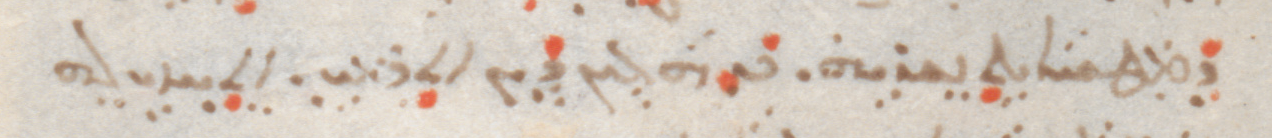ܕܡܛܫܝܐܝܬ ܢܫܪܝܗ̇. ܟܕ ܗܠܝܢ ܕܝܢ ܐܬܪܥܝ܆ ܐܬܚܙܝ ܠܗ
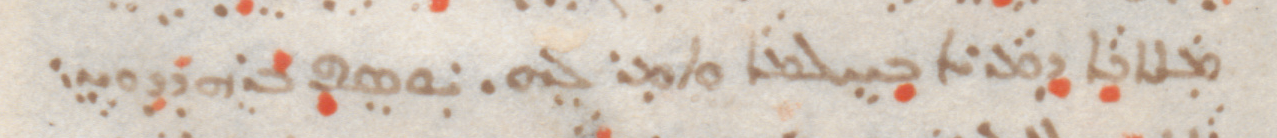ܡܠܐܟܐ ܕܡܪܝܐ ܒܚܠܡܐ ܘܐܡ̣ܪ ܠܗ. ܝܘܣܦ ܒܪܗ ܕܕܘܝܕ܉
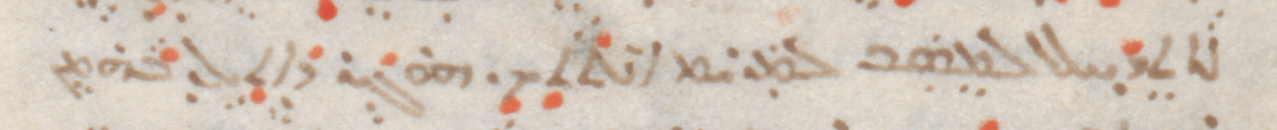ܠܐ ܬܕܚܠ ܠܡܣܒ ܠܡܪܝܡ ܐܢܬܬܟ. ܗ̇ܘ ܓܝܪ ܕܐܬܝܠܕ ܒܗ̇ ܡ̣ܢ
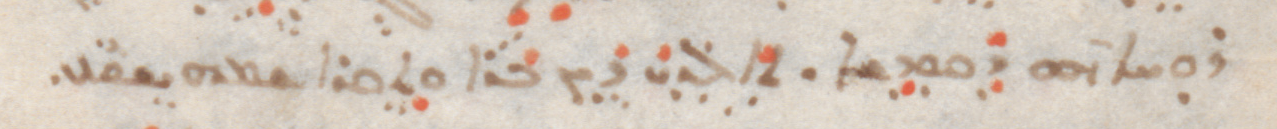ܪܘܚܐ ܗܘ ܕܩܘܕܫܐ. ܬܐܠܕ ܕܝܢ ܒܪܐ ܘܬܩܪܐ ܫܡܗ ܝܫܘܥ.
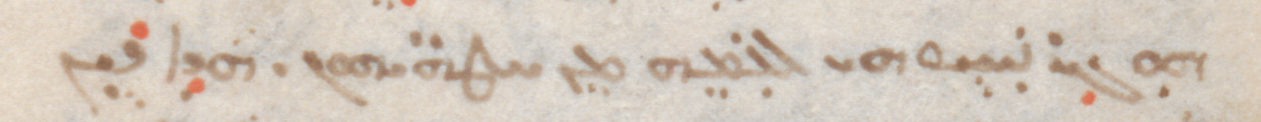ܗ̣ܘ ܓܝܪ ܢܚܝܘܗܝ ܠܥܡܗ ܡ̣ܢ ܚܛܗ̈ܝܗܘܢ. ܗܕܐ ܕܝܢ
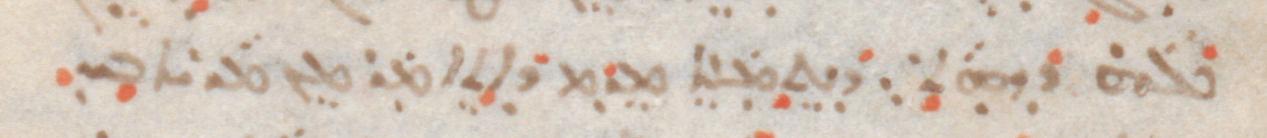ܟܠܗ̇ ܕܗܘܬ܆ ܕܢܬܡܠܐ ܡܕܡ ܕܐܬܐܡܪ ܡ̣ܢ ܡܪܝܐ ܒܝܕ
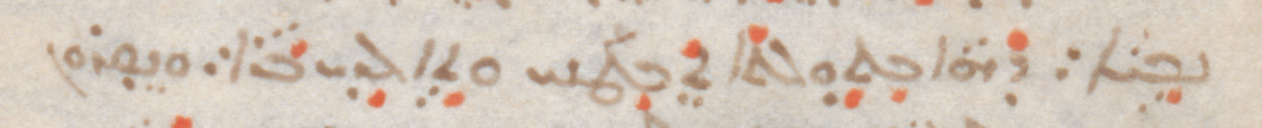ܢܒܝܐ܇ ܕܗܐ ܒܬܘܠܬܐ ܬܒܛܢܝ ܘܬܐܠܕ ܒܪܐ܇ ܘܢܩܪܘܢ
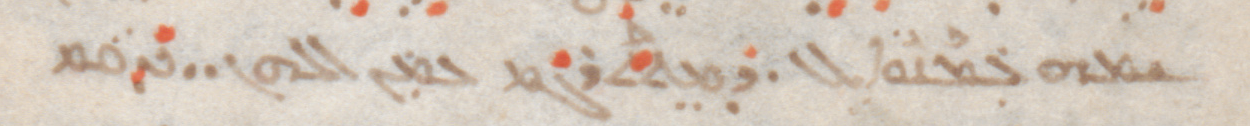ܫܡܗ ܥܡܢܘܐܝܠ. ܕܡܬܬܪܓܡ ܥܡܢ ܐܠܗܢ.. ܟܕ ܩܡ
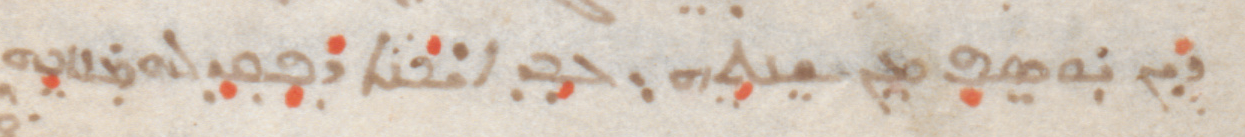ܕܝܢ ܝܘܣܦ ܡ̣ܢ ܫܢܬܗ܆ ܥܒ̣ܕ ܐܝܟܢܐ ܕܦܩ̣ܕ ܠܗ ܡܠܐܟܗ
